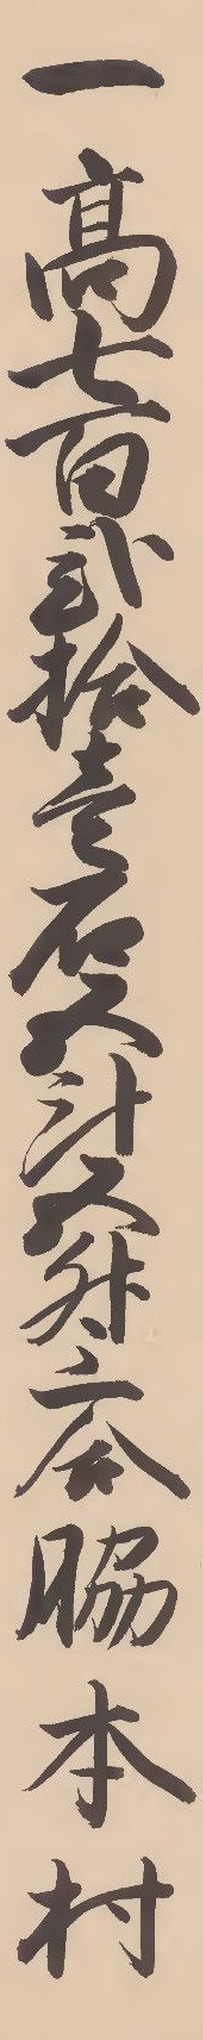一高七百弐拾壱石五斗五升三合脇本村
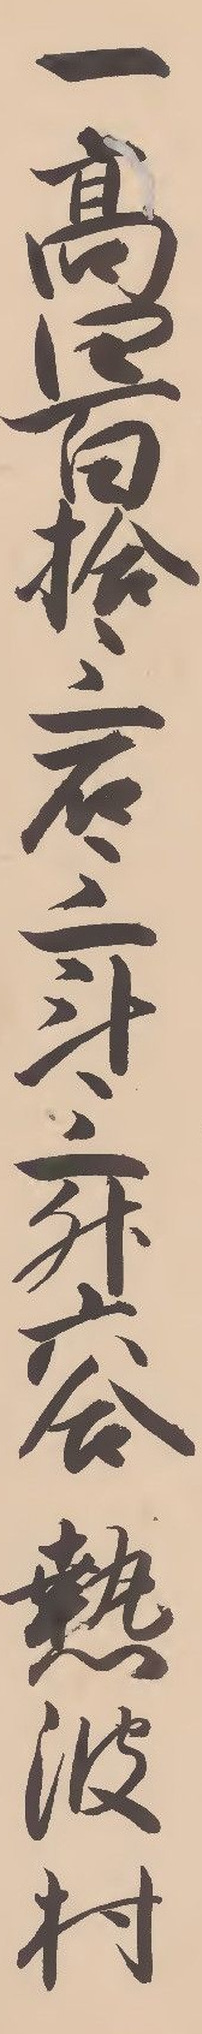一高四百拾三石三斗三升六合熱波村
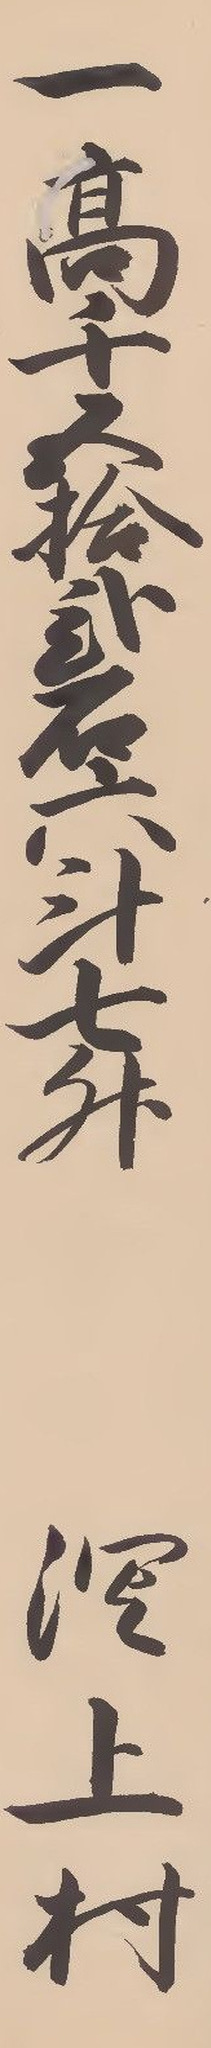一高千五拾弐石六斗七升潟上村
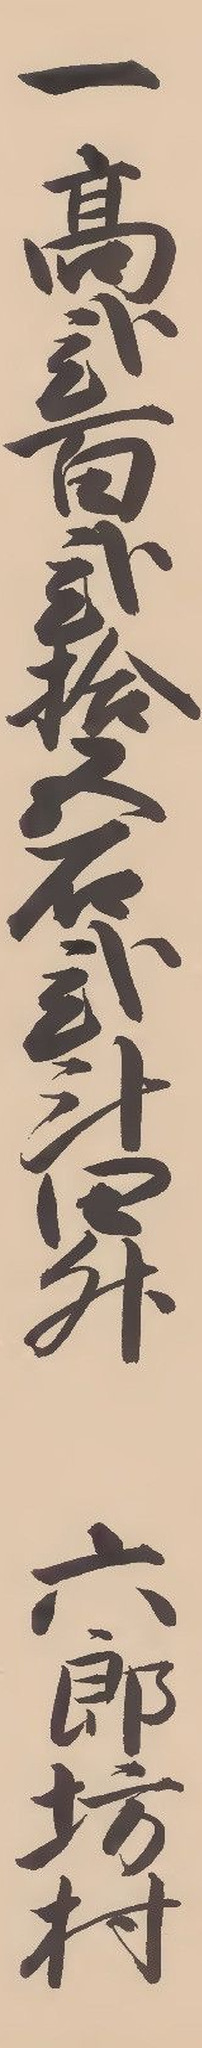一高弐百弐拾五石弐斗四升六郎坊村
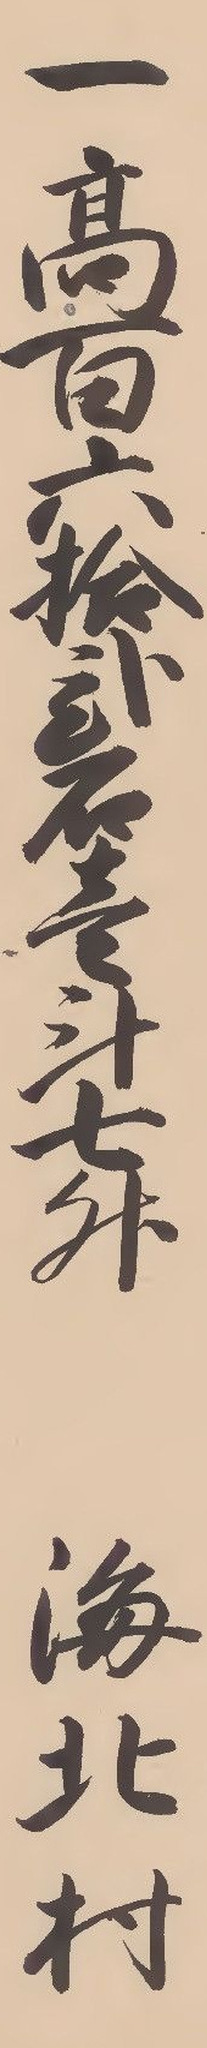一高百六拾弐石壱斗七升海北村
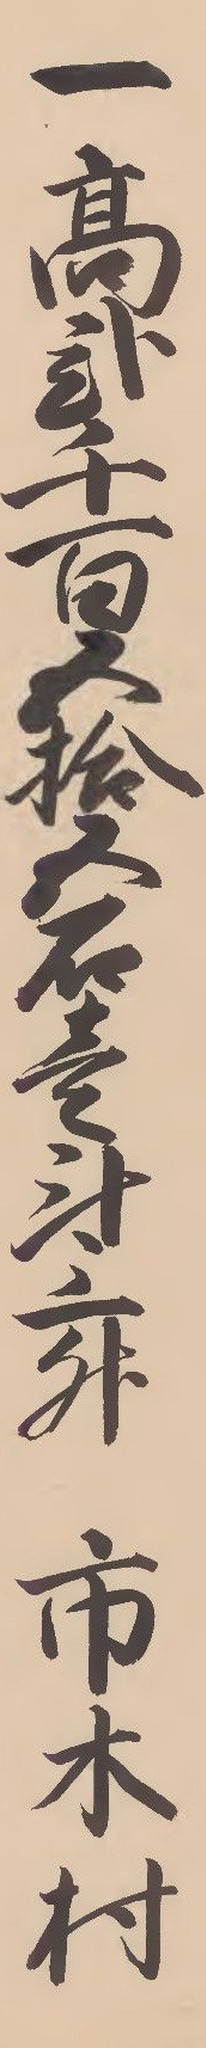一高弐千百五拾五石壱斗三升市木村

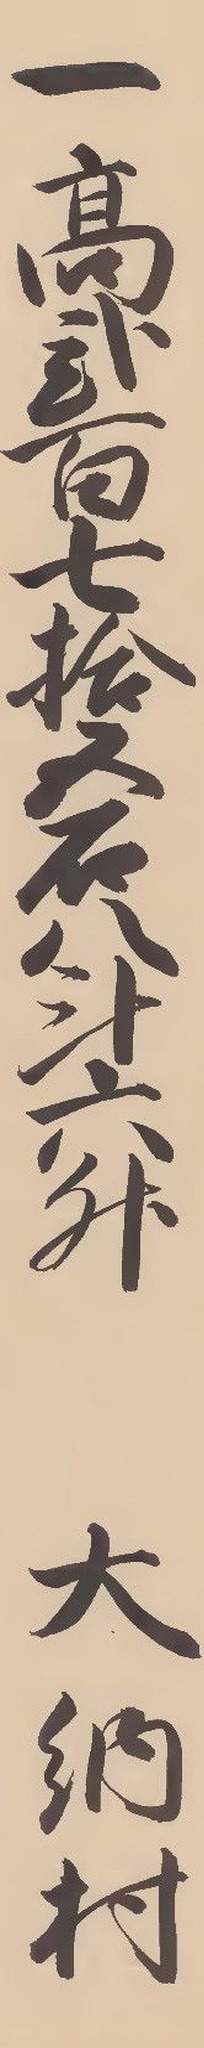一高弐百七拾五石八斗六升大納村
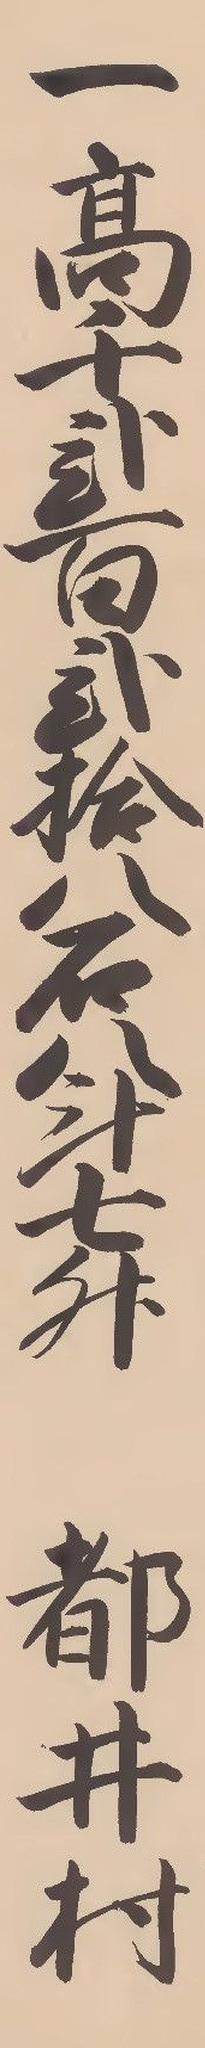一高千弐百弐拾八石八斗七升都井村
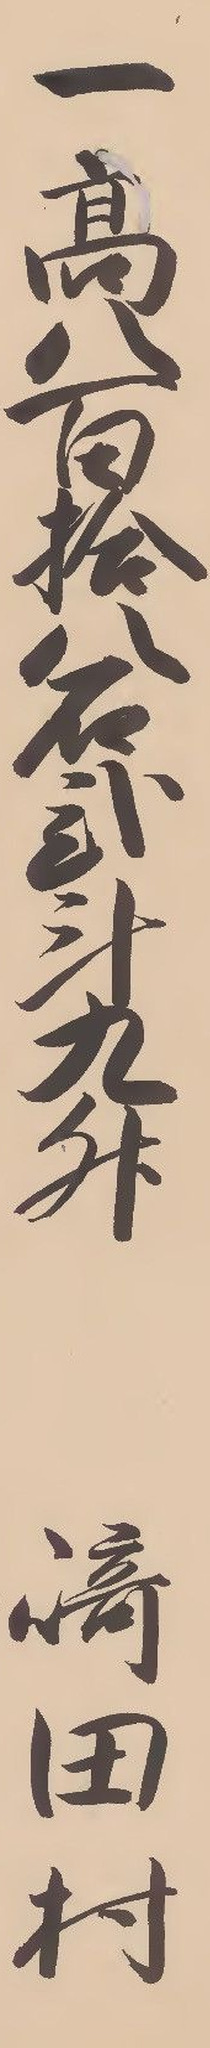一高八百拾八石弐斗九升崎田村
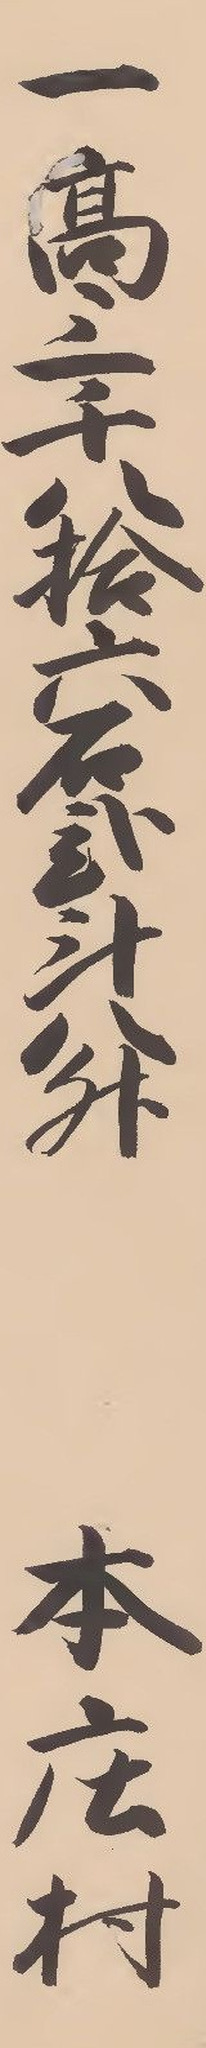一高三千八拾六石弐斗八升本庄村
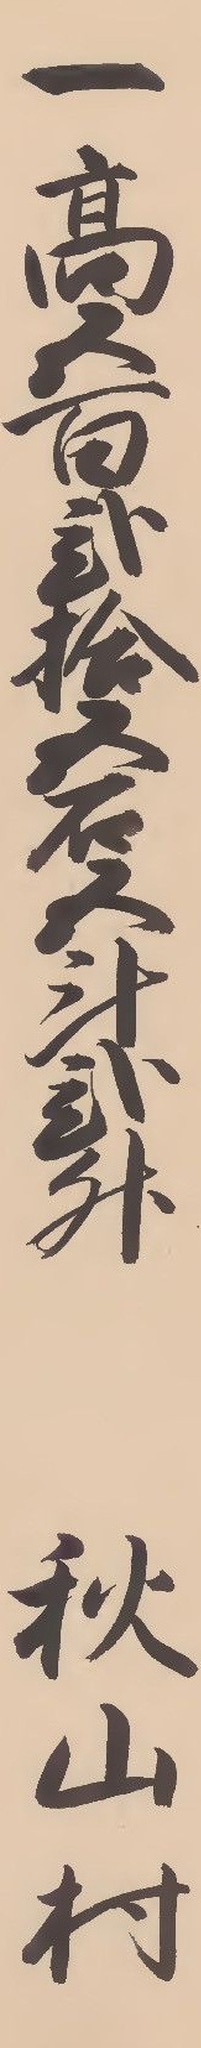一高五百弐拾五石五斗弐升秋山村
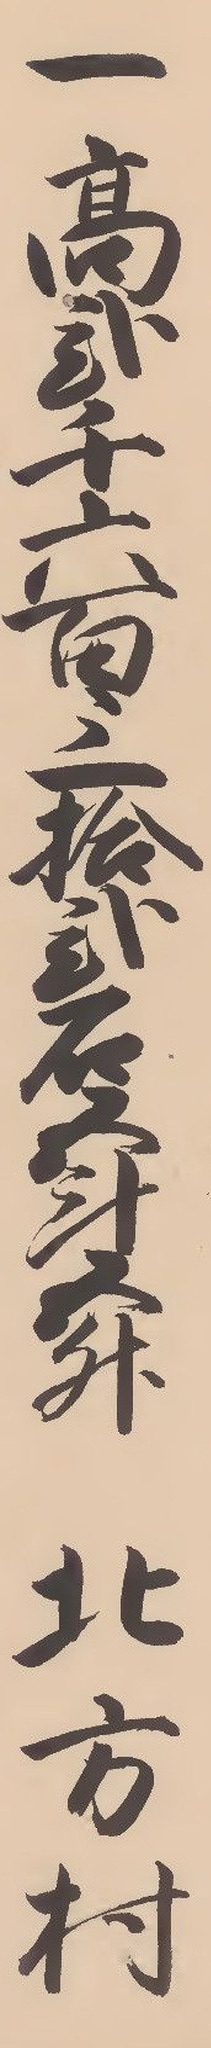一高弐千六百三拾弐石五斗五升北方村
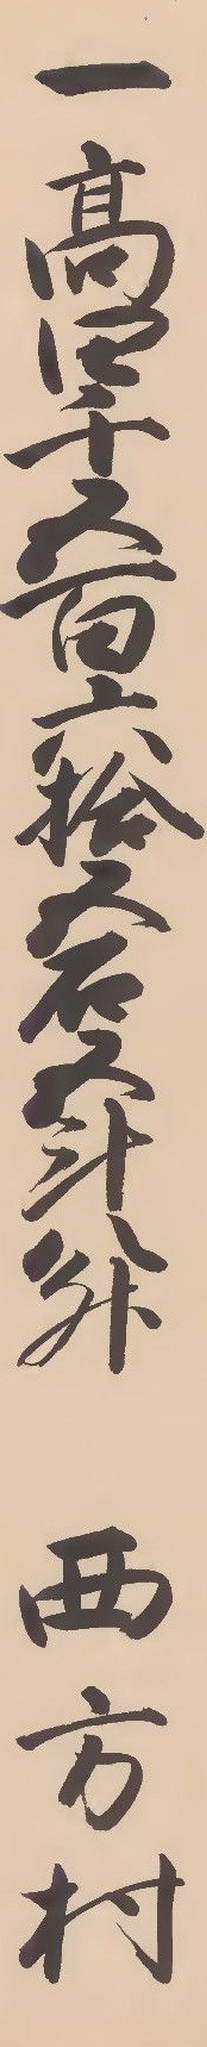一高四千五百六拾五石五斗八升西方村

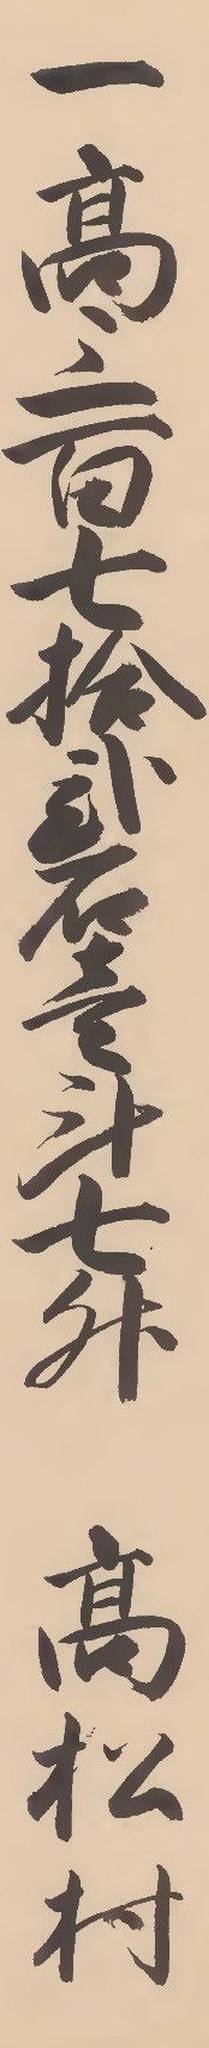一高三百七拾弐石壱斗七升高松村
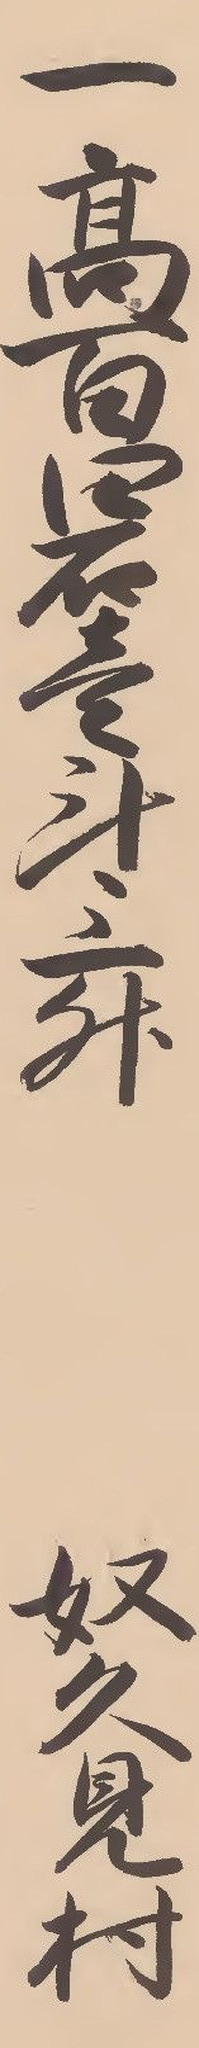一高百四石壱斗三升奴久見村
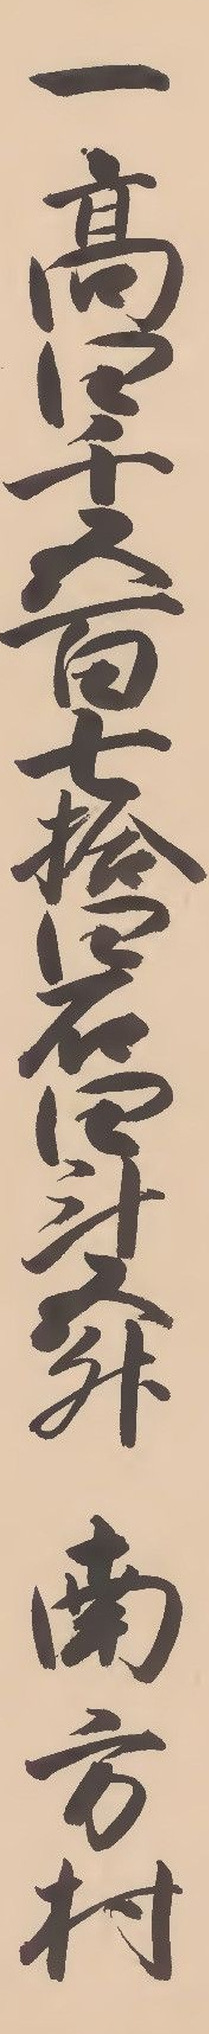一高四千五百七拾四石四斗五升南方村
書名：日向国郷帳
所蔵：国立公文書館 National Archives of Japan
